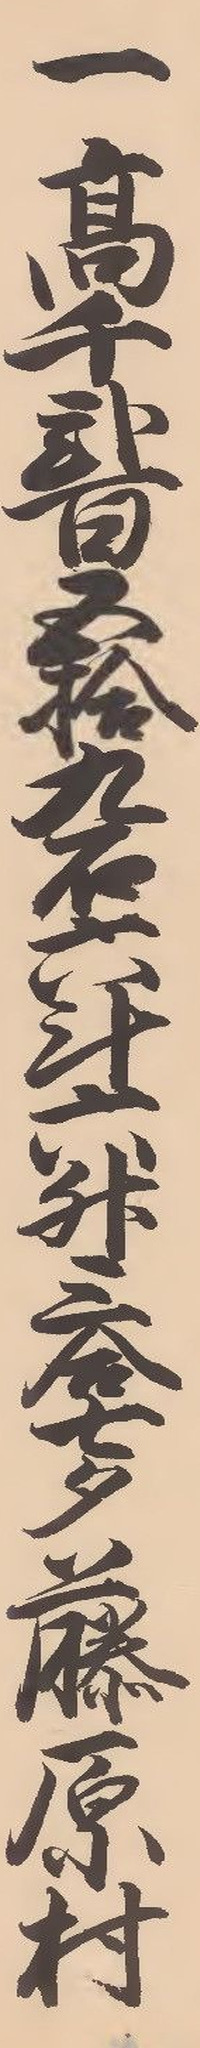一高千弐百五拾九石六斗六升三合七勺藤原村
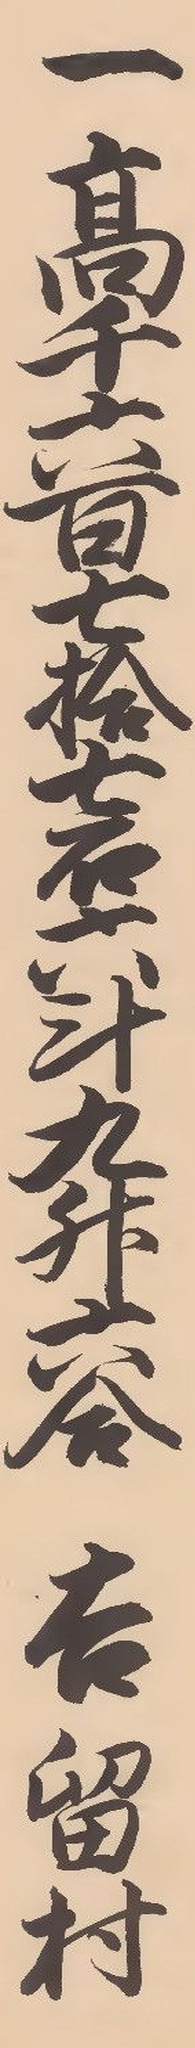一高千六百七拾七石六斗九升六合吉留村

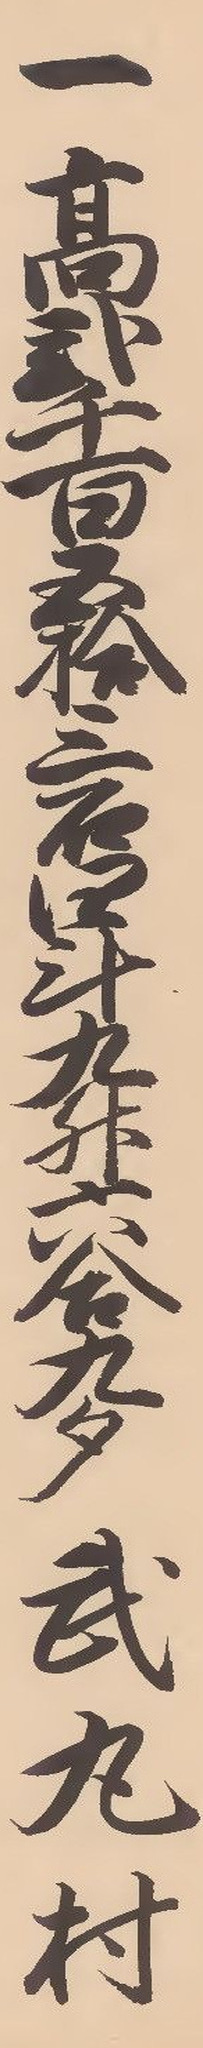一高弐千百五拾三石四斗九升六合九勺武丸村
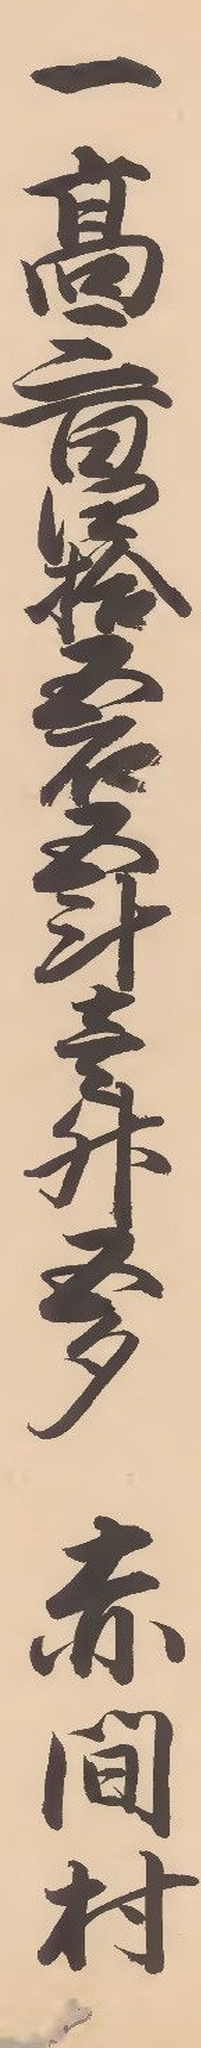一高三百四拾五石五斗壱升五勺赤間村
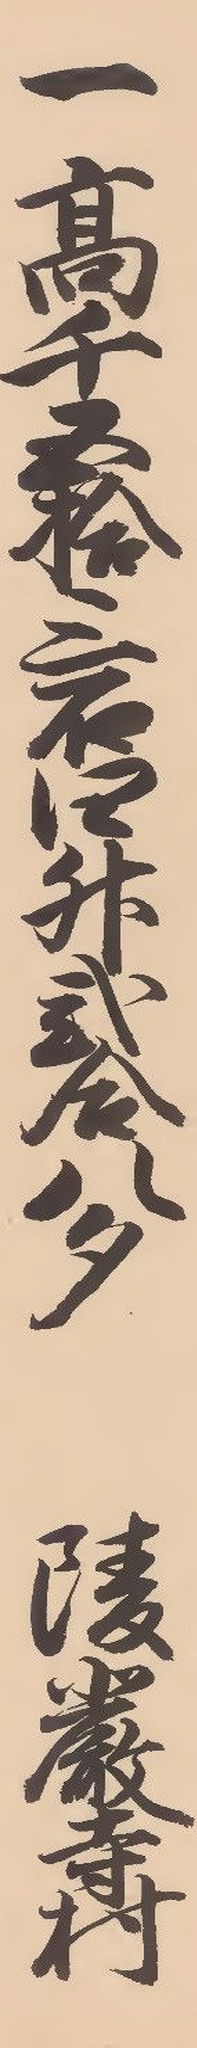一高千五拾三石四升弐合八勺陵厳寺村
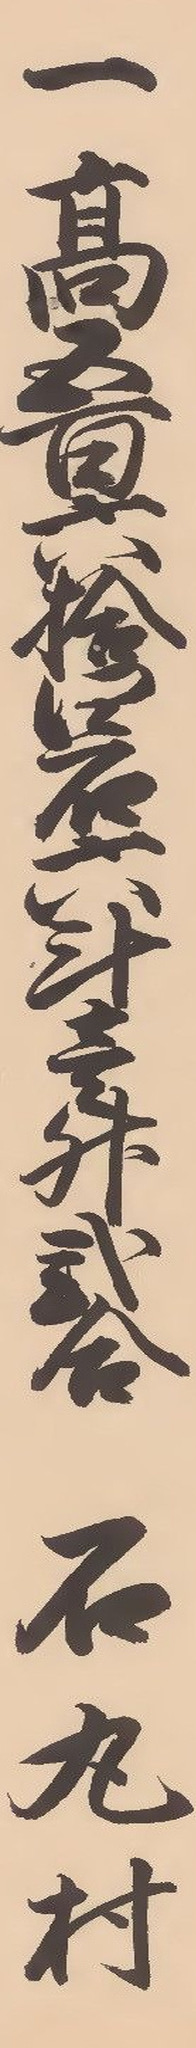一高五百六拾四石六斗壱升弐合石丸村
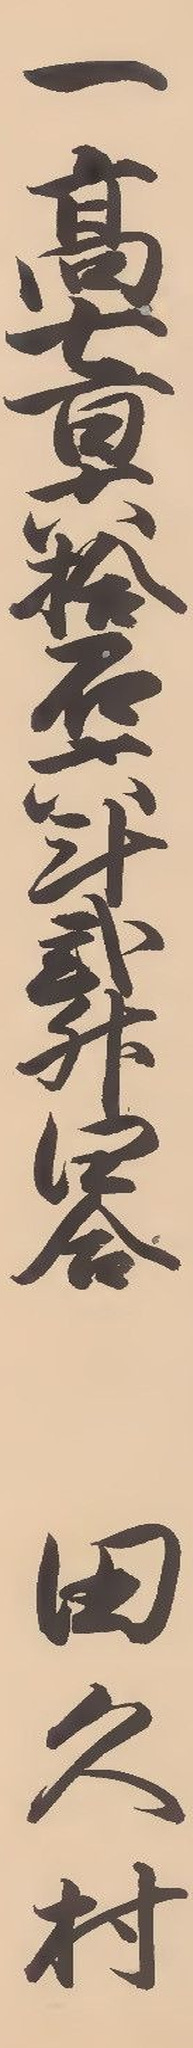一高七百六拾石六斗弐升四合田久村
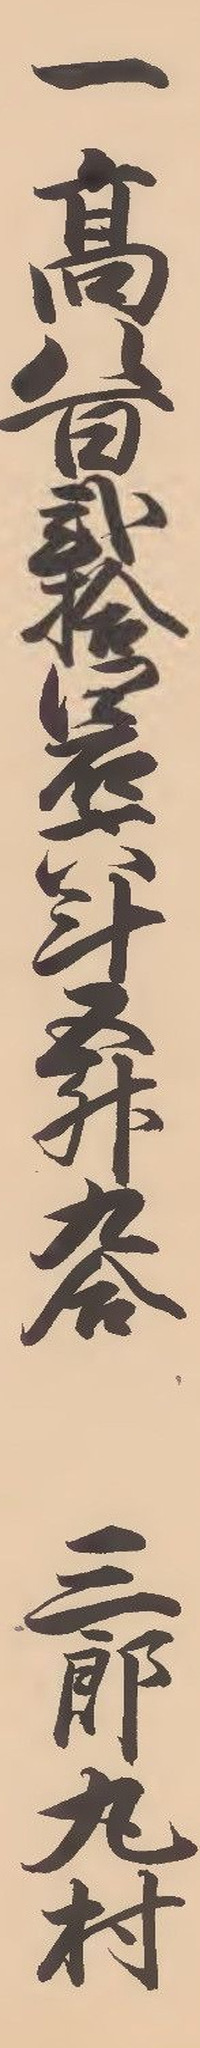一高八百弐拾四石六斗五升九合三郎丸村
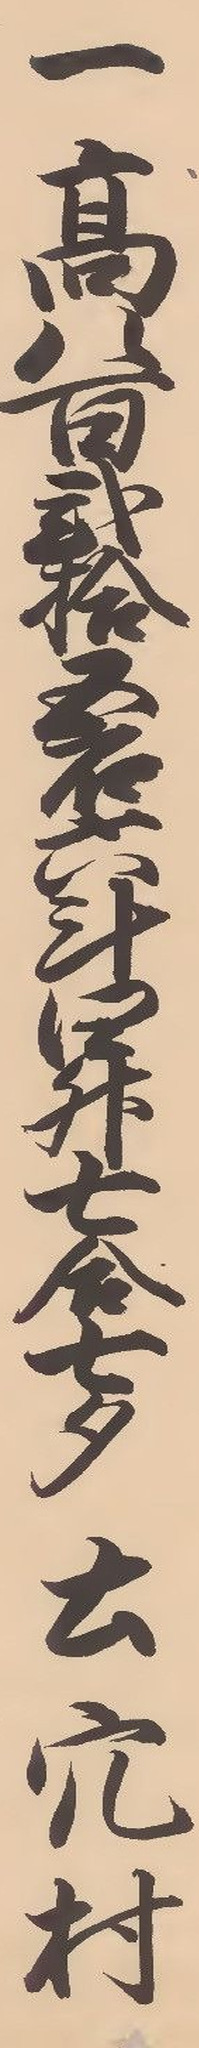一高八百弐拾五石六斗四升七合七勺土穴村
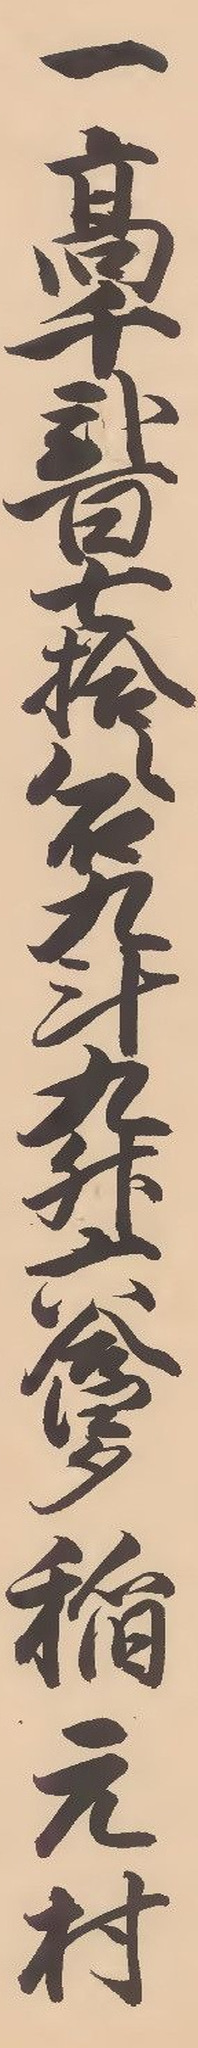一高千弐百七拾八石九斗九升六合四勺稲元村

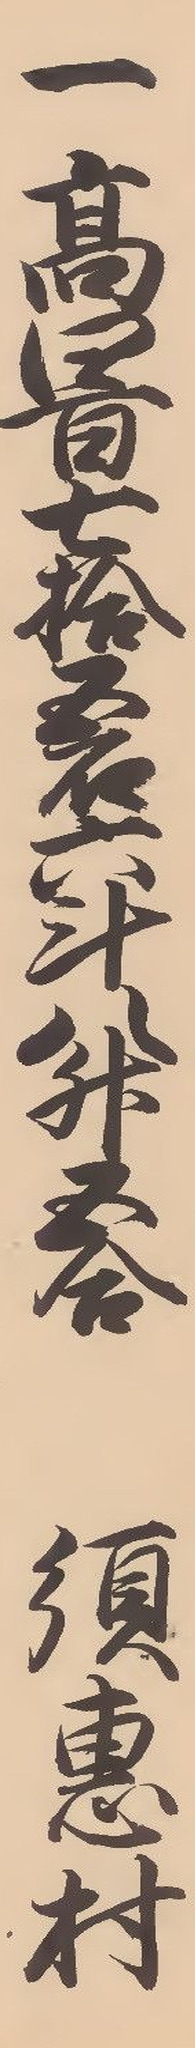一高四百七拾五石六斗八升五合須恵村
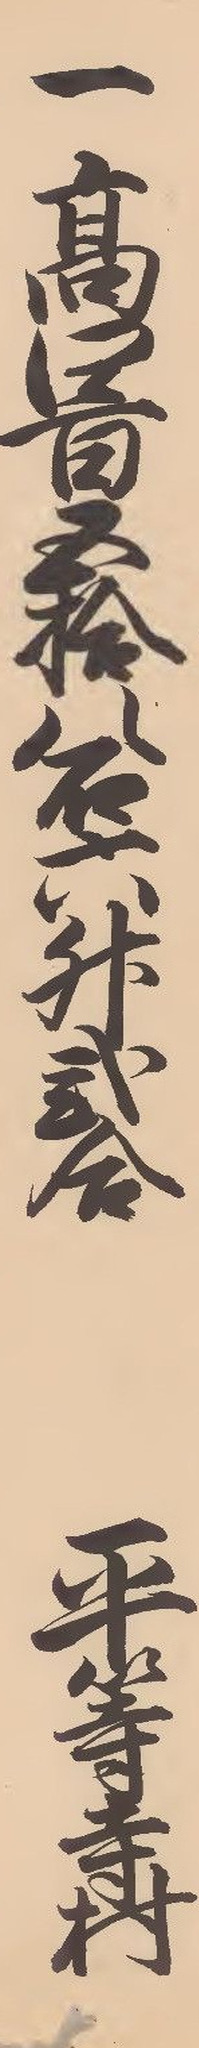一高四百五拾八石六升弐合平等寺村
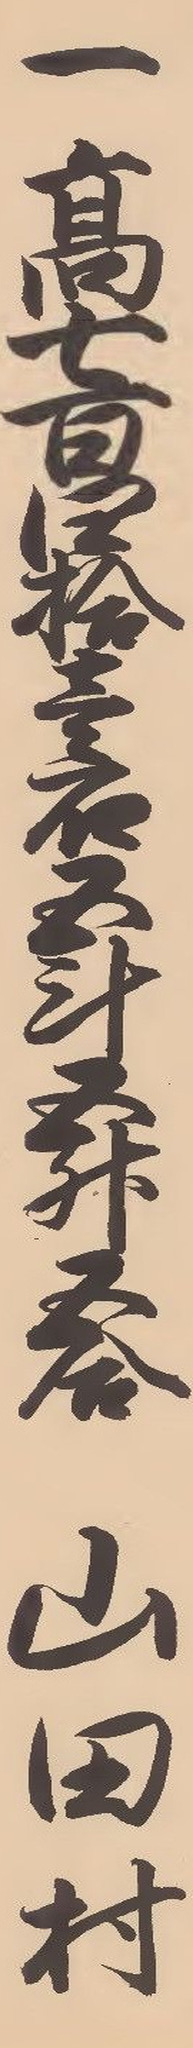一高七百四拾壱石五斗五升五合山田村
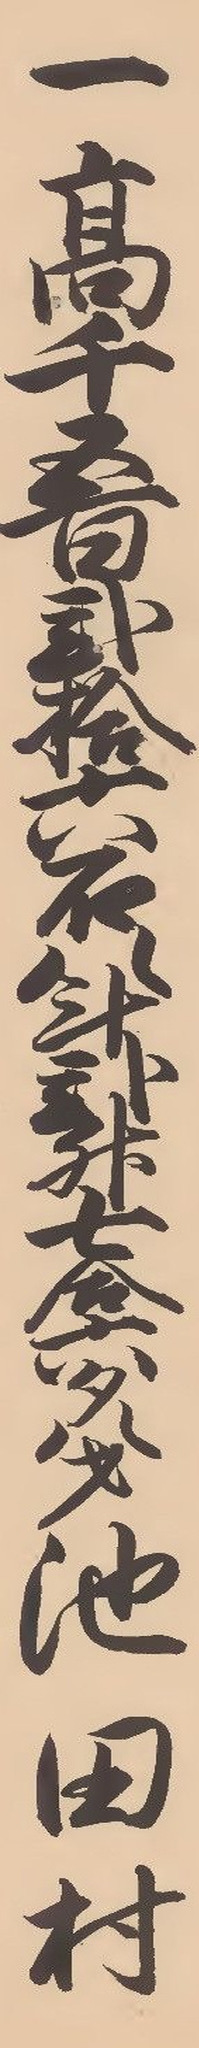一高千五百弐拾六石八斗弐升七合六勺八才池田村
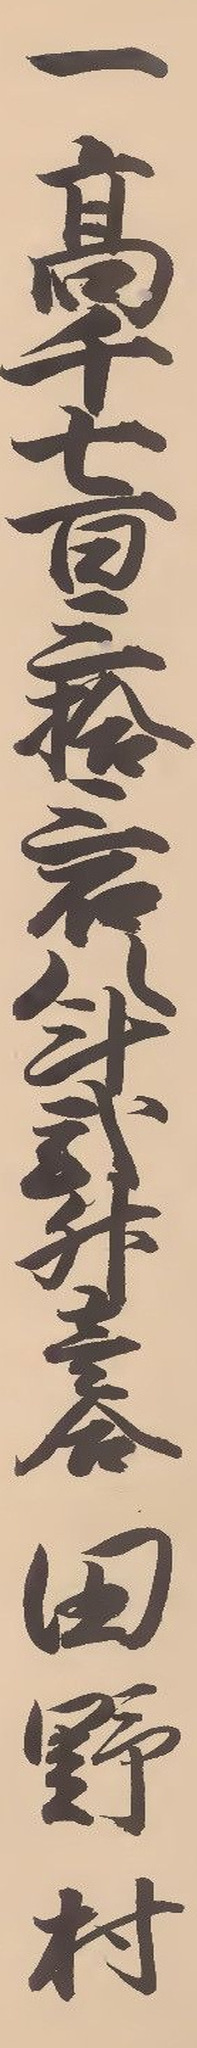一高千七百三拾三石八斗弐升壱合田野村
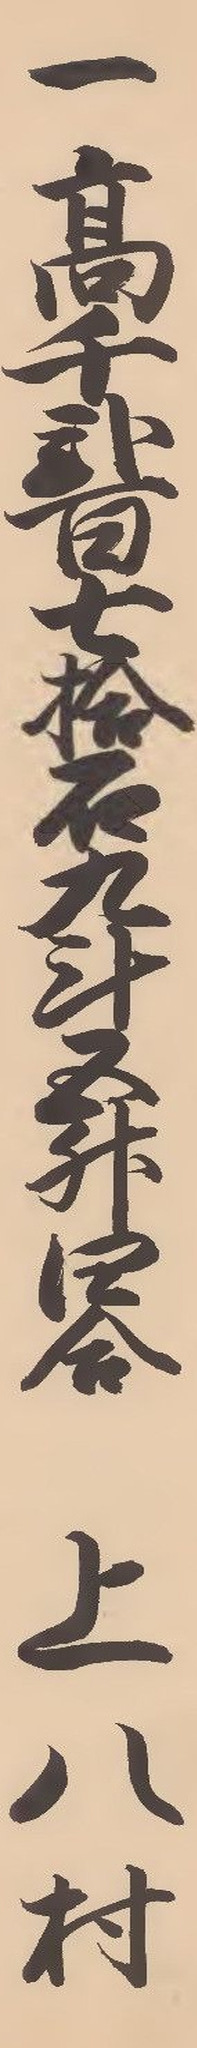一高千弐百七拾石九斗五升四合上八村
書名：筑前国郷帳
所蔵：国立公文書館 National Archives of Japan
